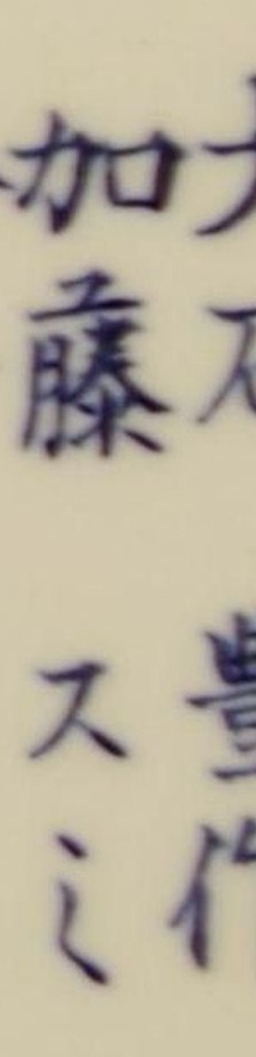加藤スミ
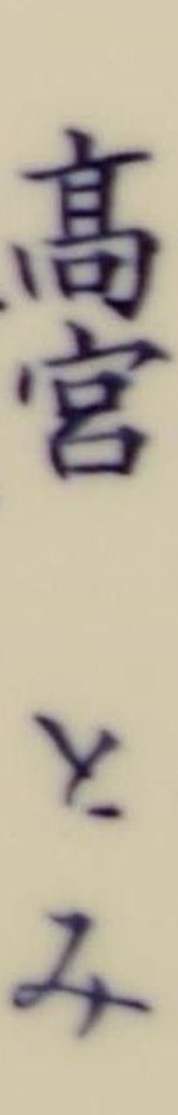高宮とみ
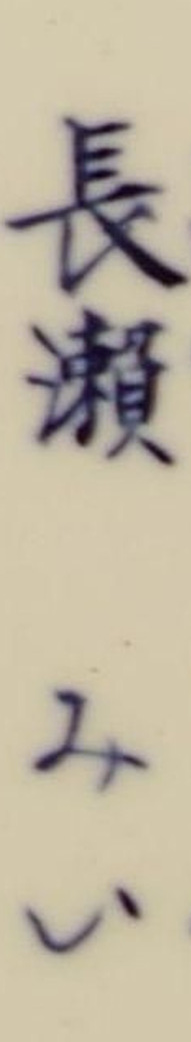長瀬みい
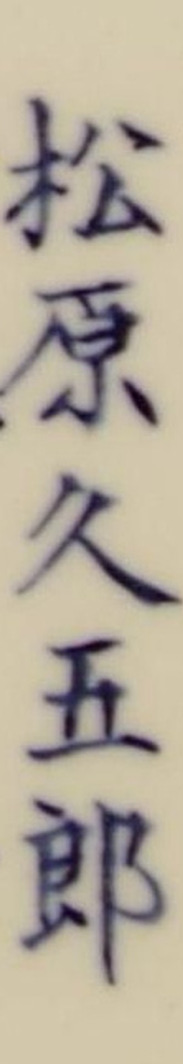松原久五郎
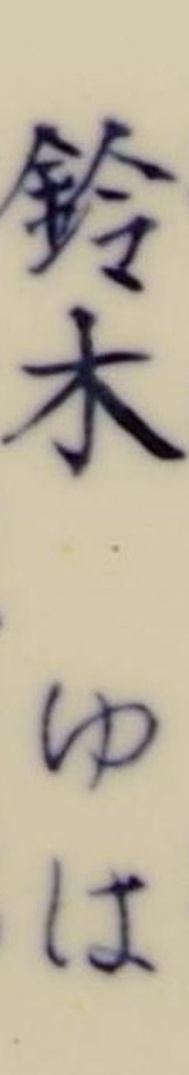鈴木ゆは
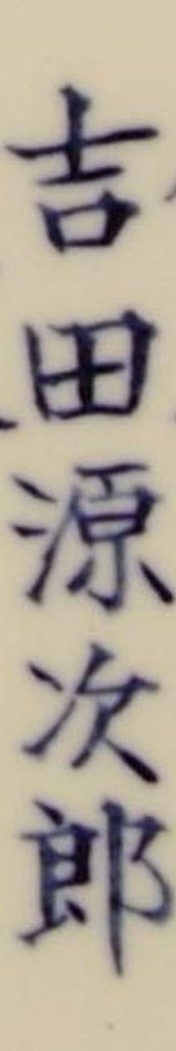吉田源次郎
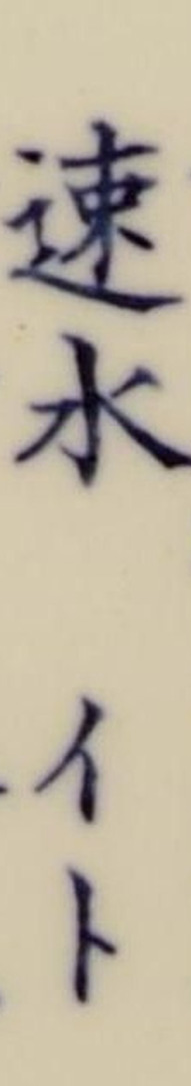速水イト
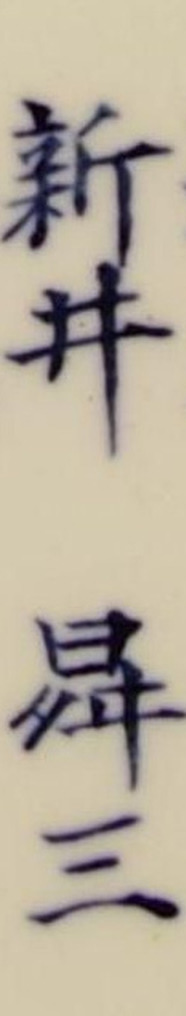新井昇三
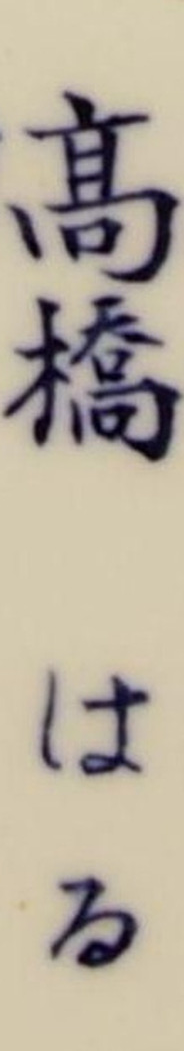高橋はる
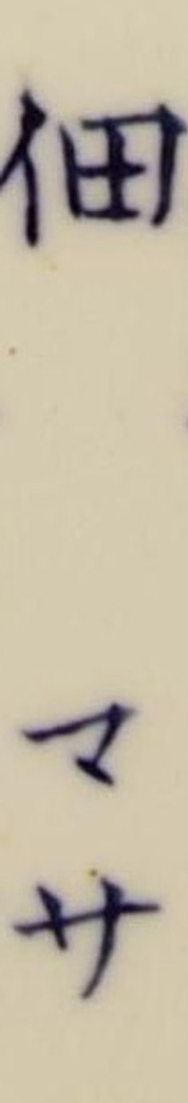佃マサ
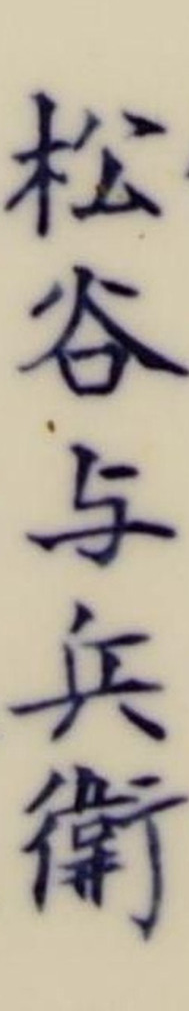松谷与兵衛
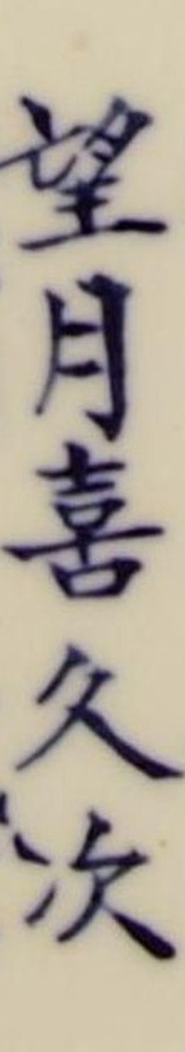望月喜久次
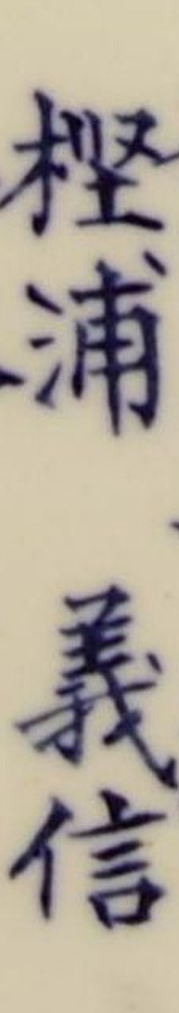樫浦義信
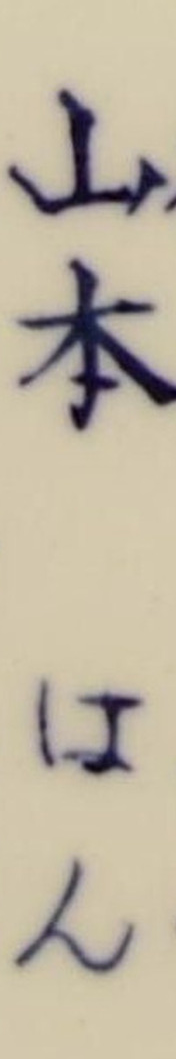山本はん
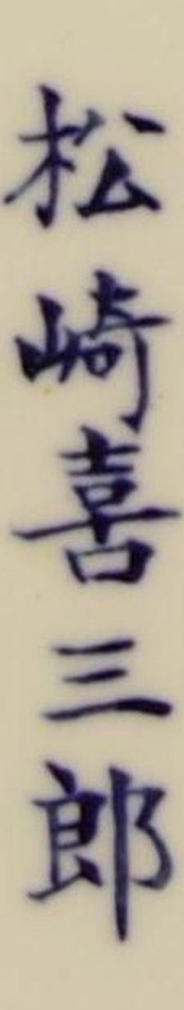松崎喜三郎
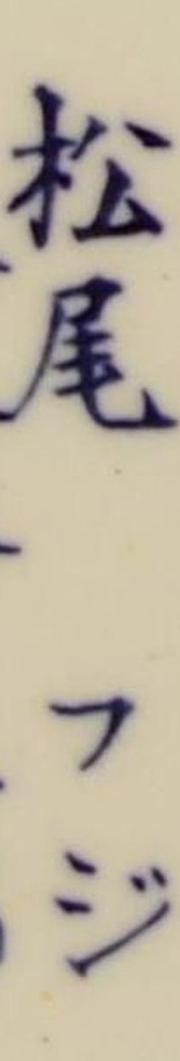松尾フジ
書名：E~L
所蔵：高野山金剛峯寺
